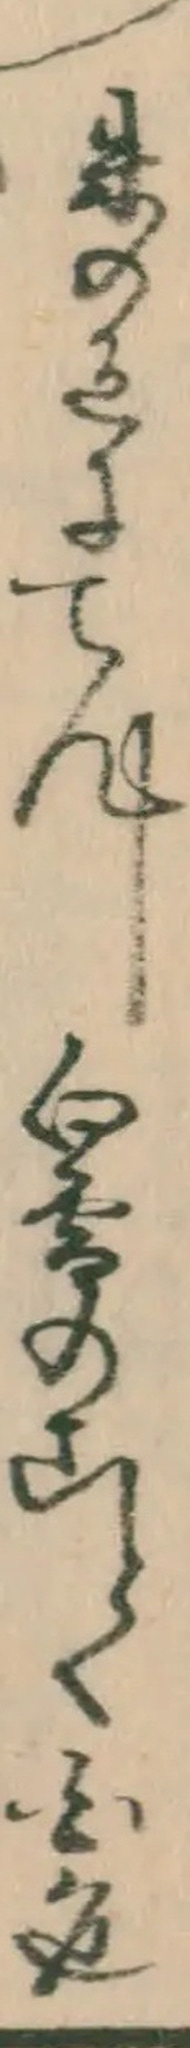朱の色にてんし白雪のことく白色
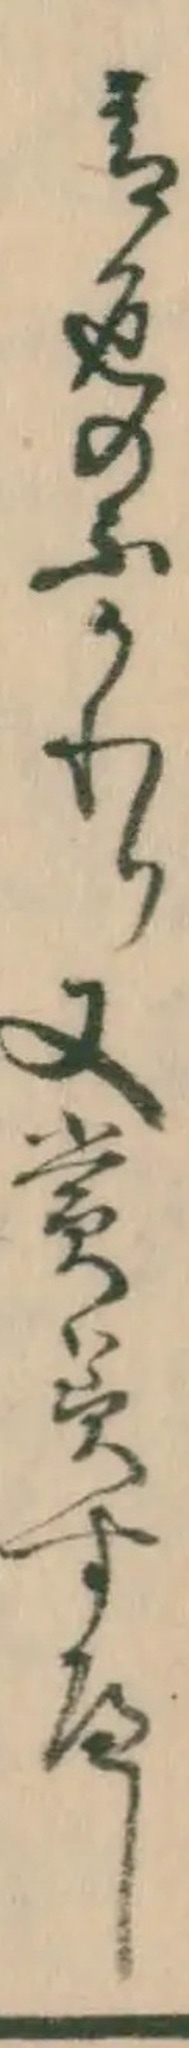青色のふかわり又賞美すへし
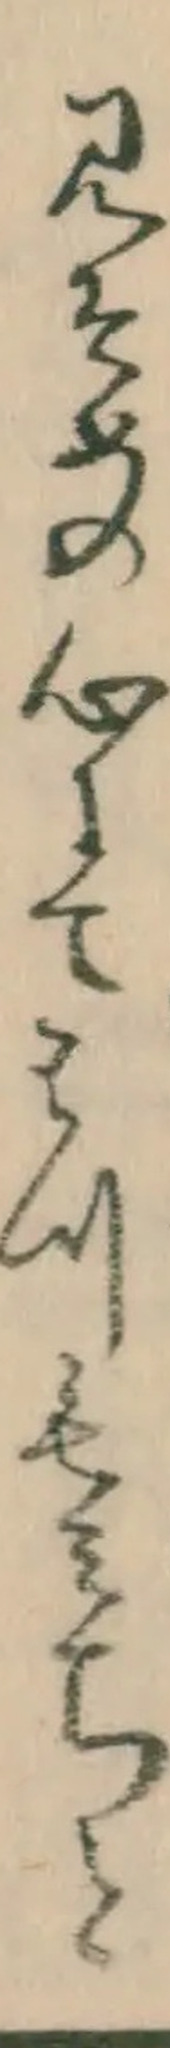見そめの心にてはつもみちと
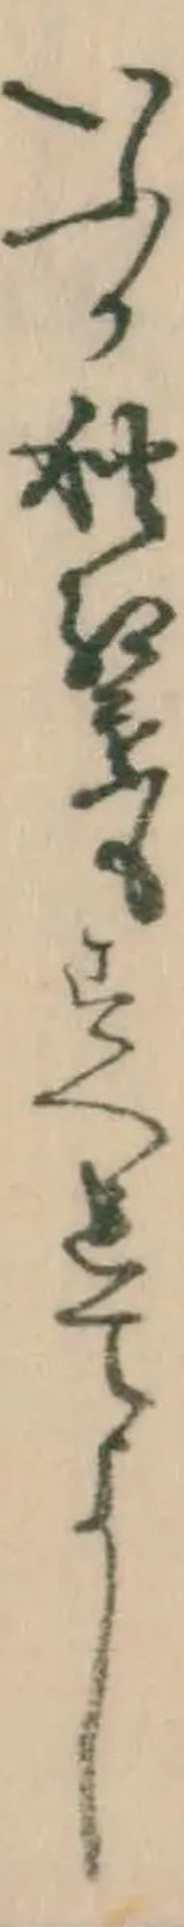いふか秋紅葉もすくれてよし
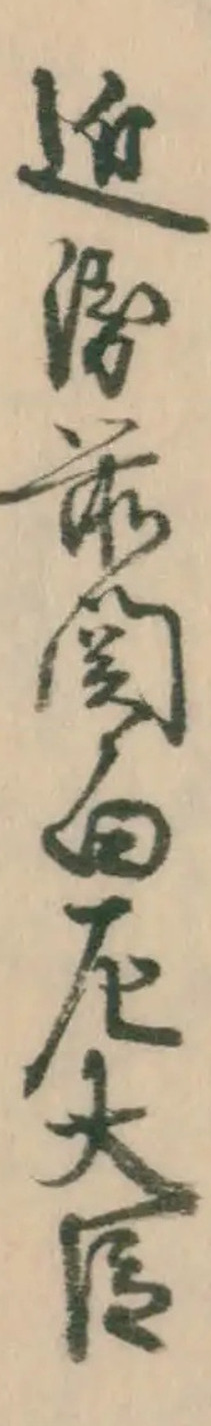近衛前関白左大臣
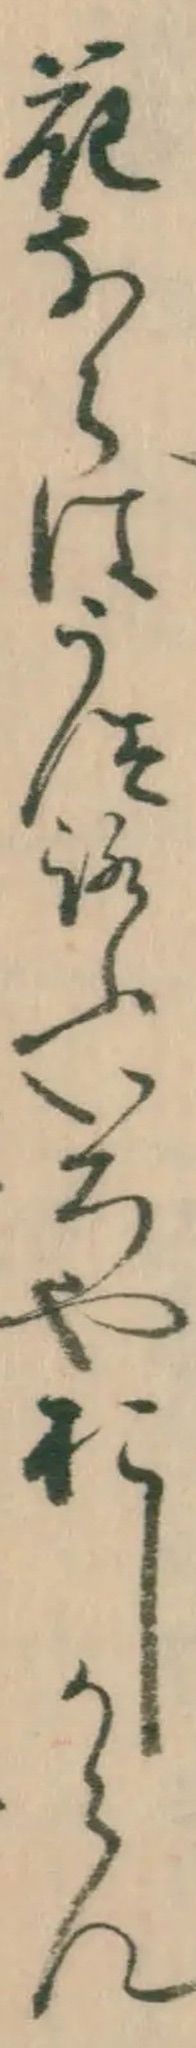花ならはうつろふいろやおしからん
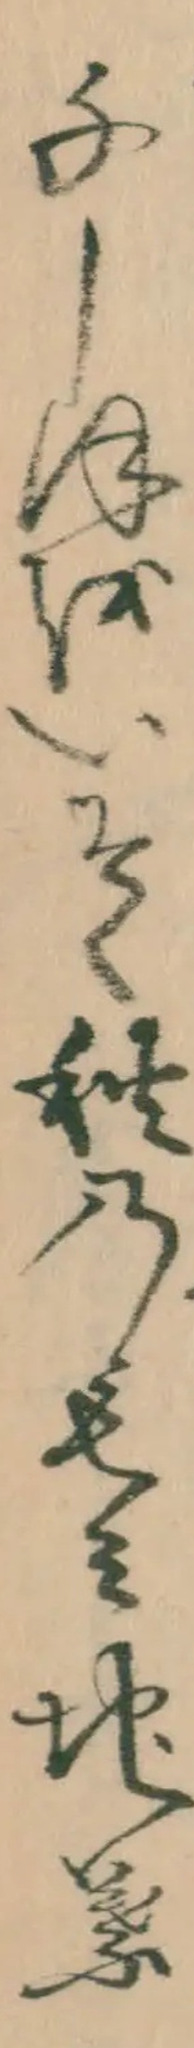ちしほをいそく秋のもみち葉

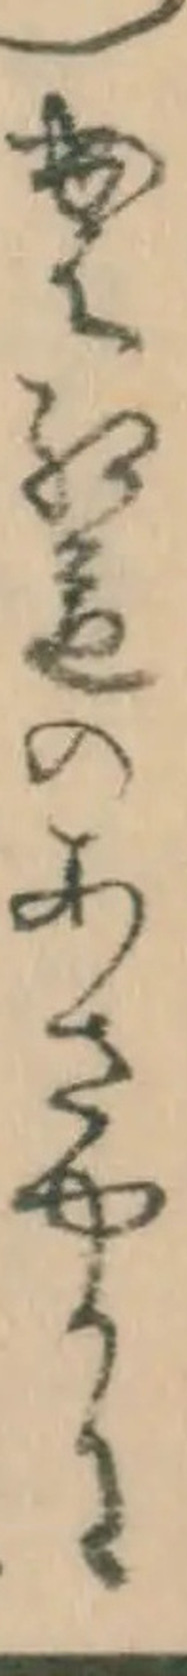出は紅色のあさやかに
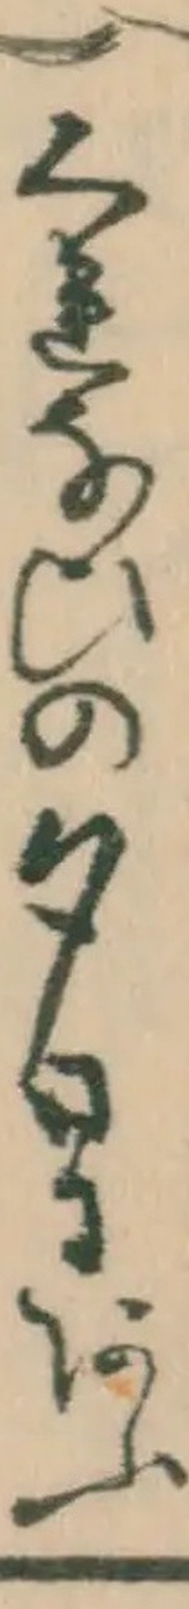くれなひの夕日にあふ
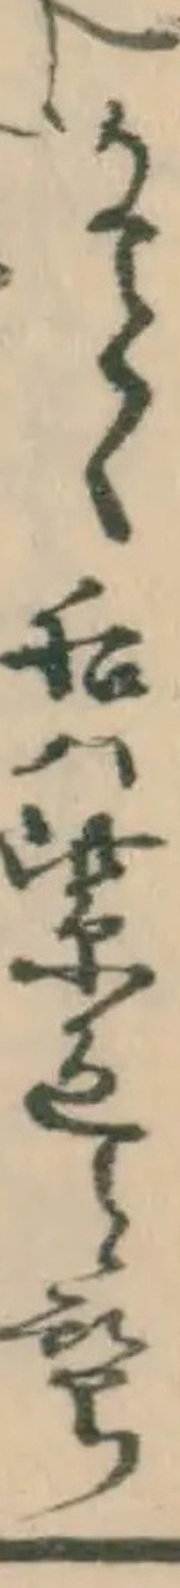かことく后は紫色と替り
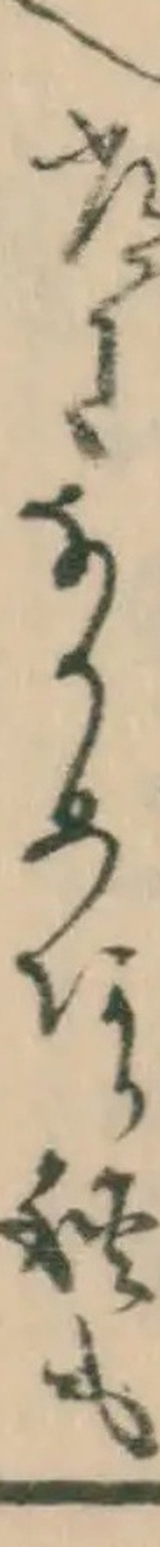常になかめあり秋も
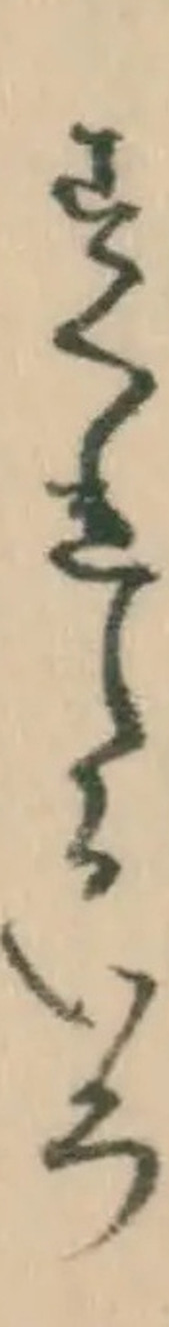すくれたるいろ
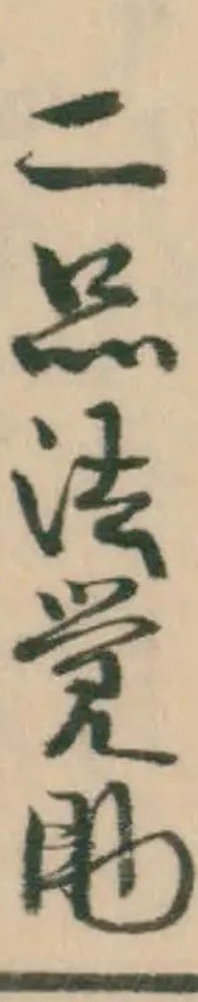二品法覚助
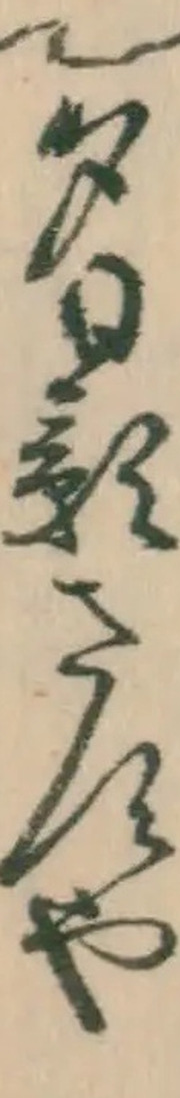夕日影さすや
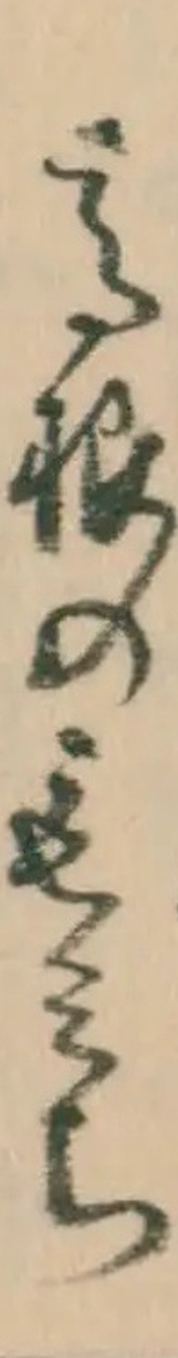高根のもみち
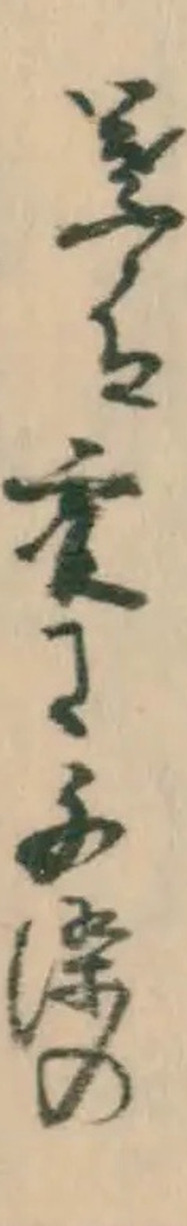葉は空に千染の
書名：紅葉集
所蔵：国立国会図書館 National Diet Library, JAPAN
